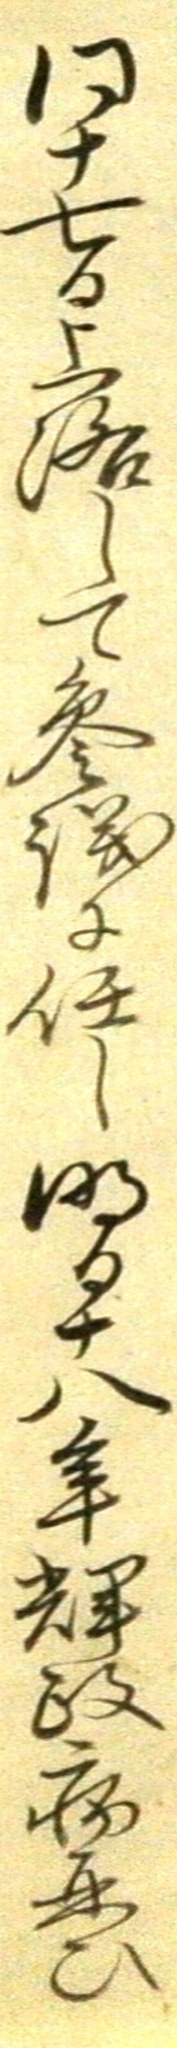同十七日上洛して参議に任し明る十八年輝政病再ひ
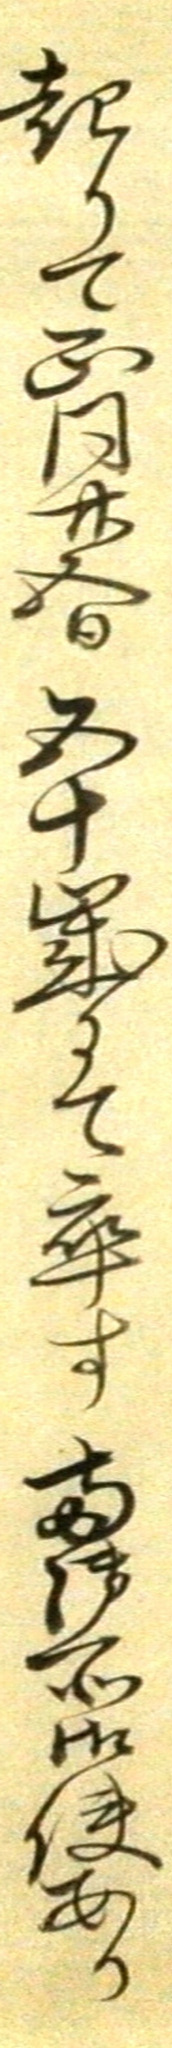起りて正月廿五日五十歳にて卒す両御所御使あり
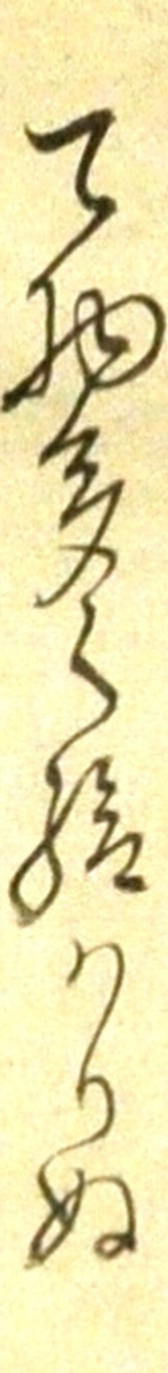て物多く給はりぬ
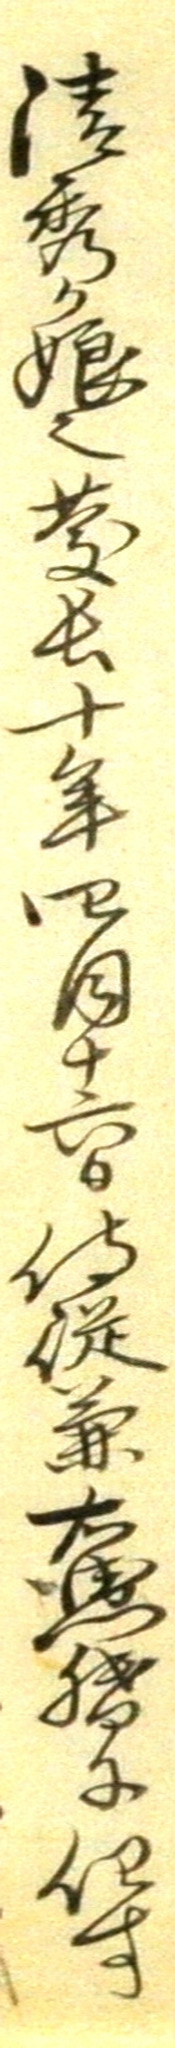清秀か娘也慶長十年四月十六日侍従兼右衛門督に任す
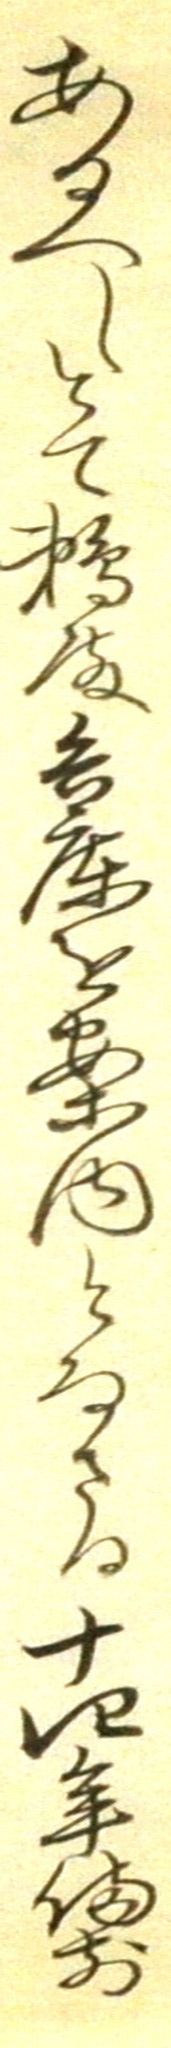あるへしとて鵜殿兵庫を案内となさる十四年備前
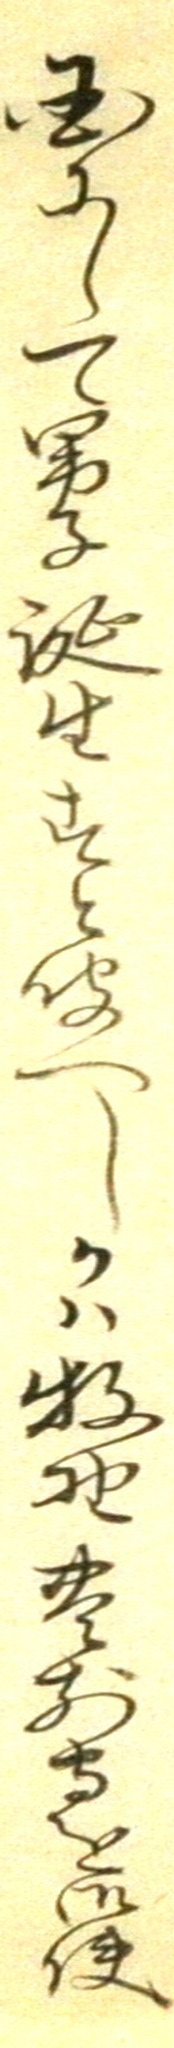国にして男子誕生すと聞へしかは牧野豊前守を御使
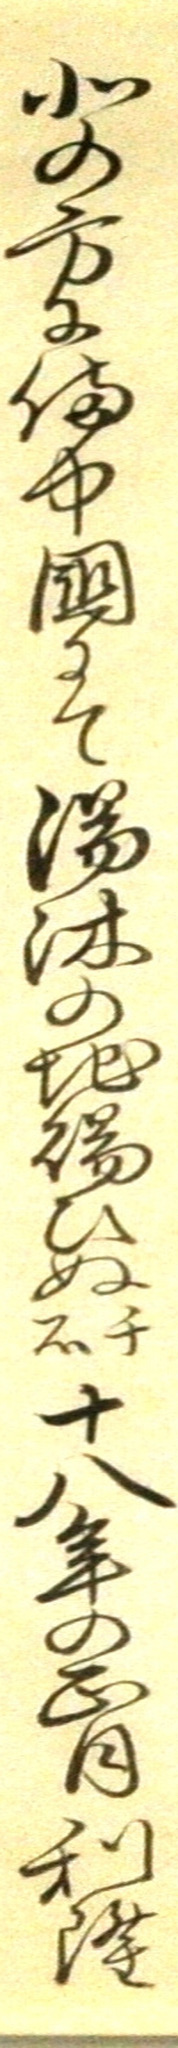北の方に備中国にて湯沐の地賜ひぬ千石十八年の正月利隆
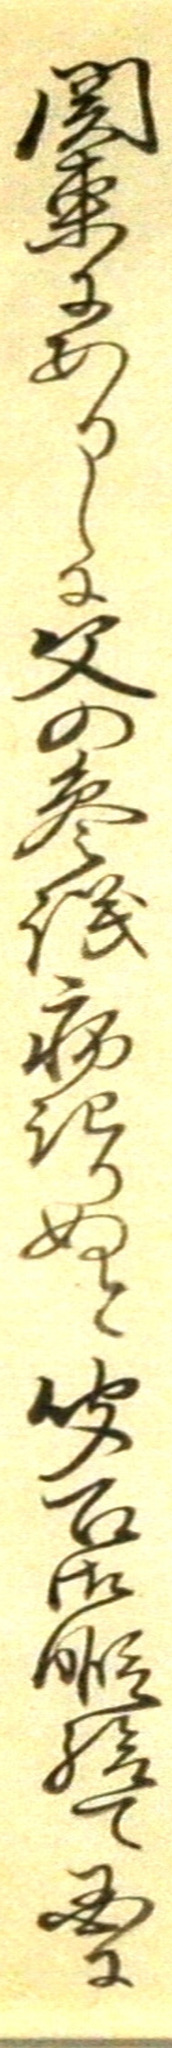関東にありしに父の参議病起りぬと聞召御暇給て国に

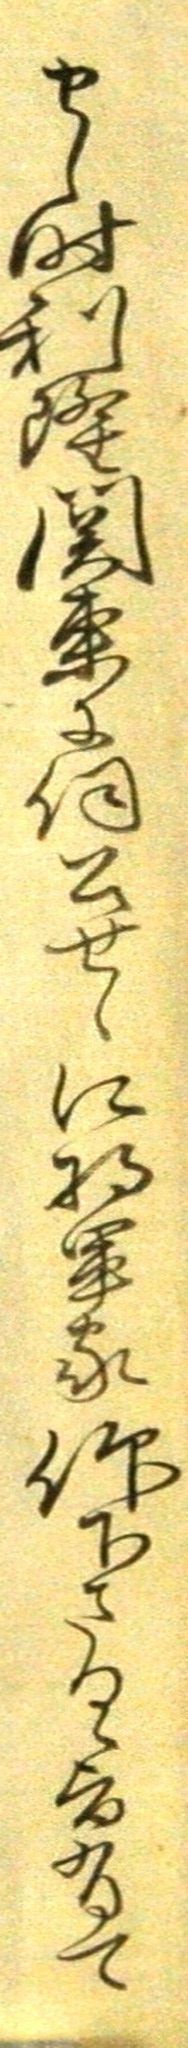せし時利隆関東に伺公せしに将軍家仰下さるゝ旨有て
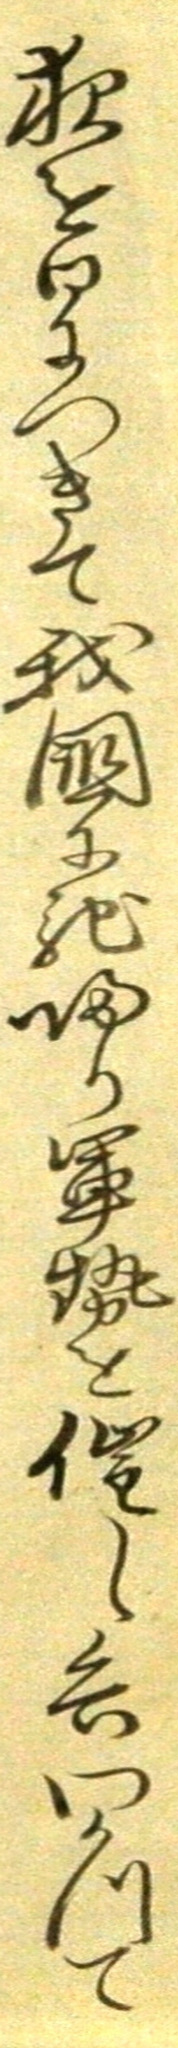夜を日につきて我国に馳帰り軍勢を催し兵わかつて
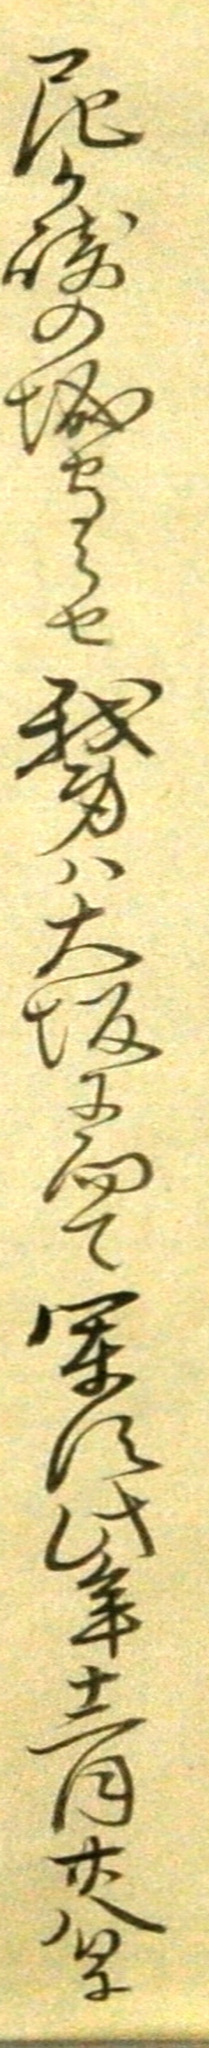尼か崎の城守らせ我身は大坂に向て軍す此年十二月廿八日に
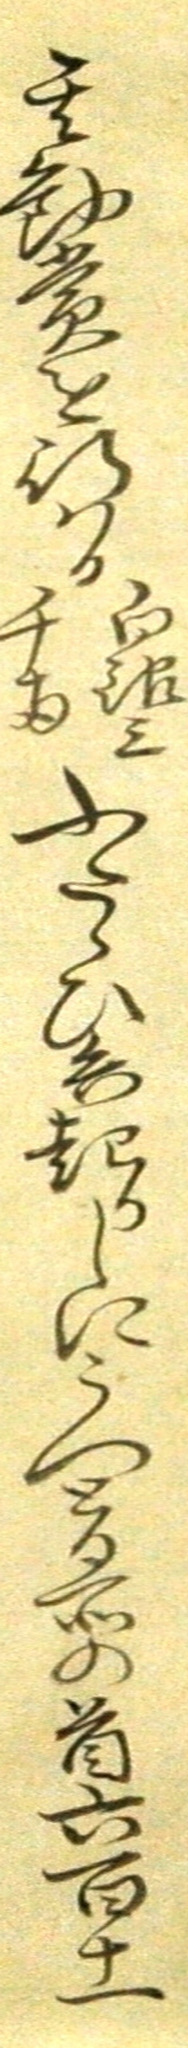其勧賞を行はる白銀三千両ふたゝひ兵起りしにうつとる所の首六百十一
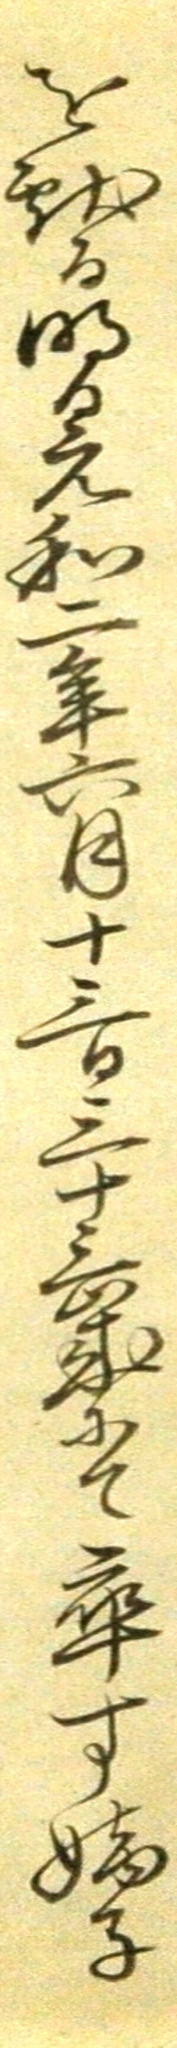を献る明る元和二年六月十三日三十三歳にて卒す嫡子
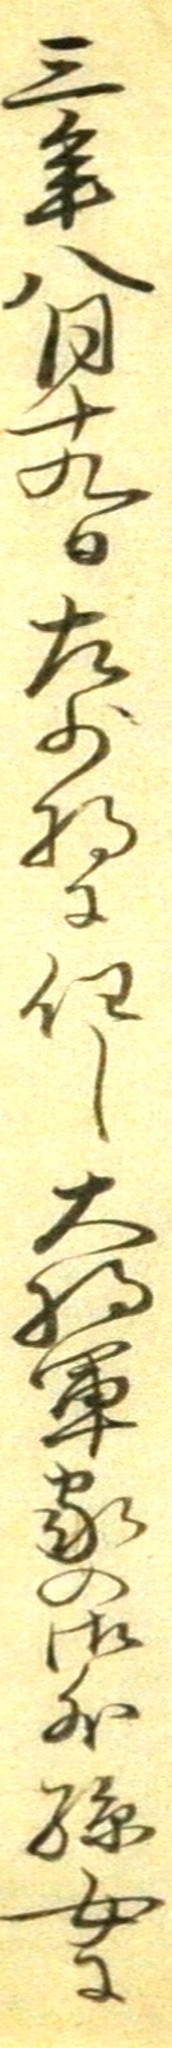三年八月十九日左少将に任し大将軍家の御外孫女に
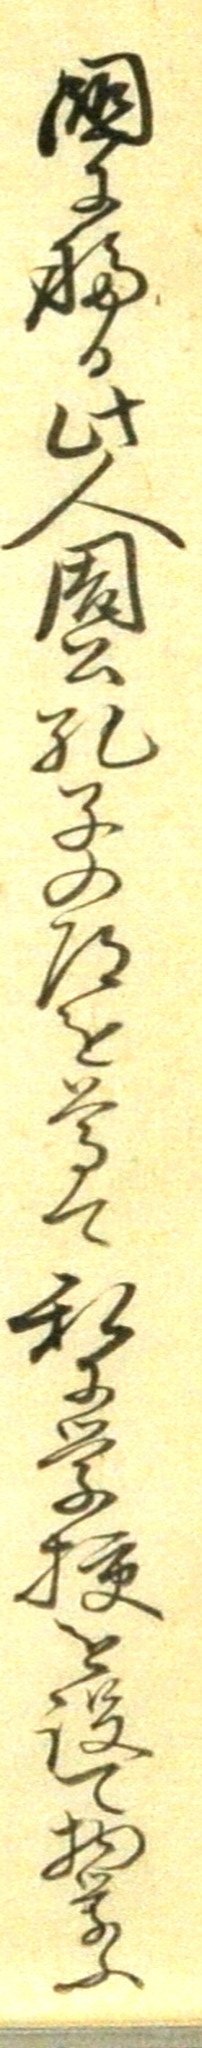国に移る此人周公孔子の道を尊て私に学校を設て物学ふ
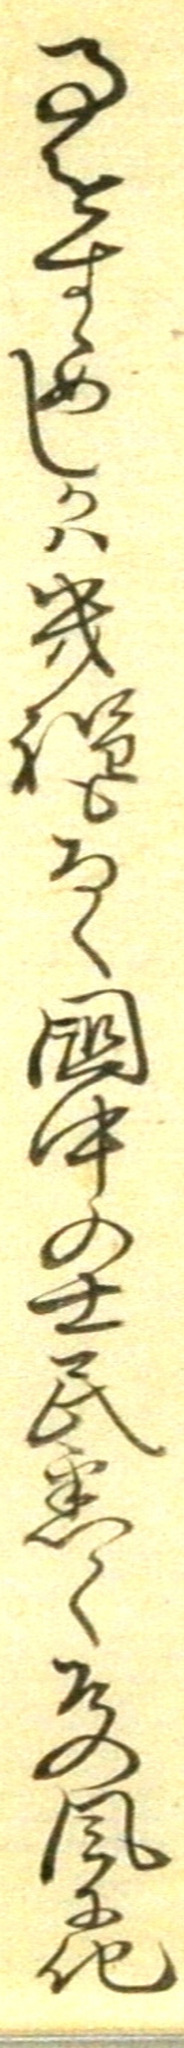事をすゝめしかは幾程もなく国中の士民悉くその風に化
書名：藩翰譜（七・上）
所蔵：伊那市立高遠町図書館・合同会社AMANE
